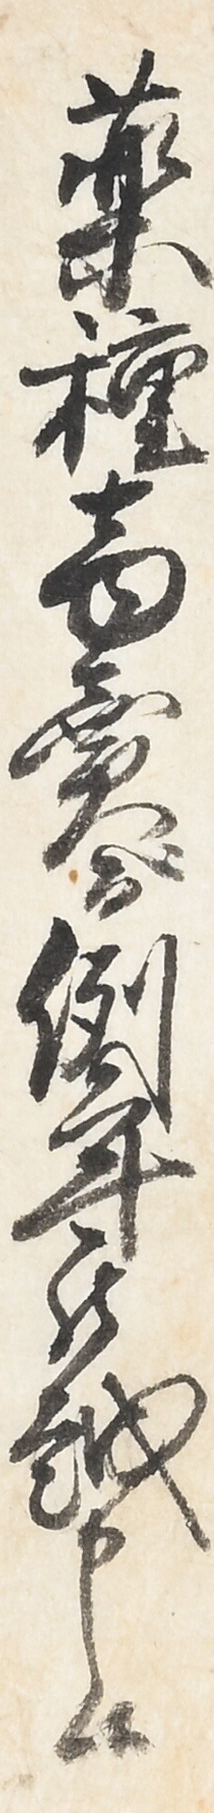薬種商売ニ而例年罷越申候
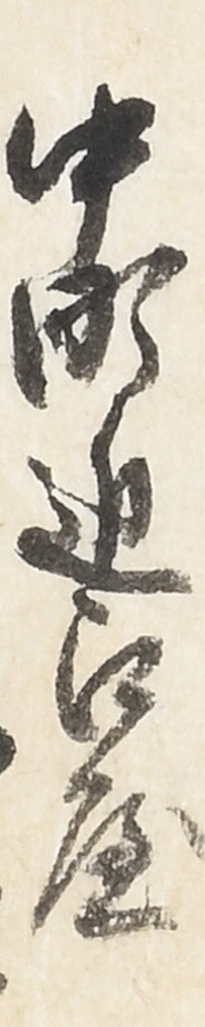中町近江屋
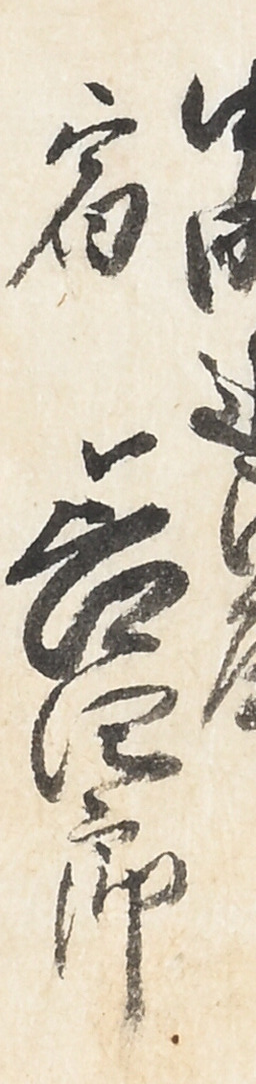宿善四郎
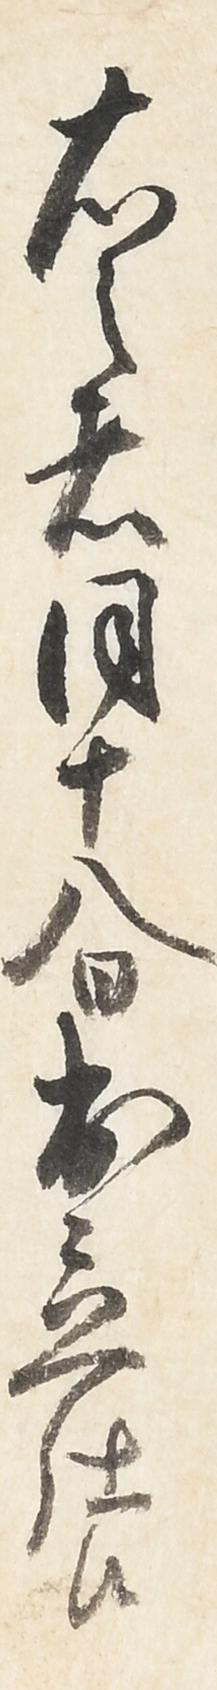右之者同十八日出立仕候
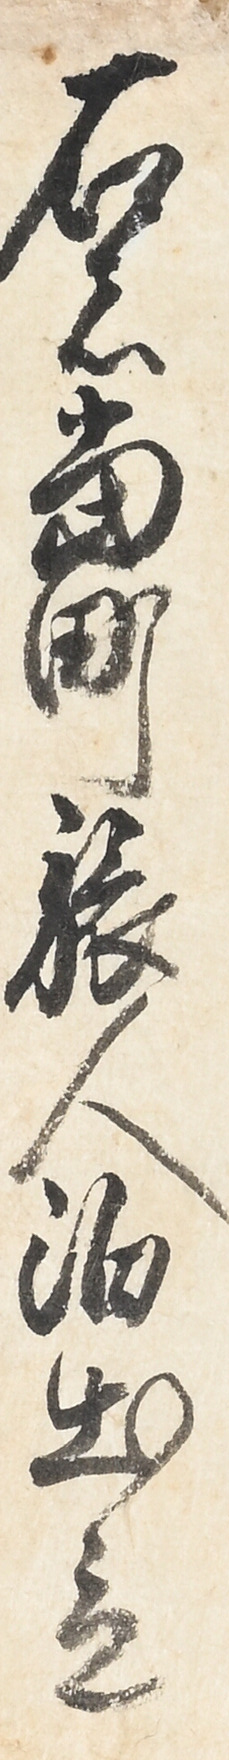右者当町旅人泊出立
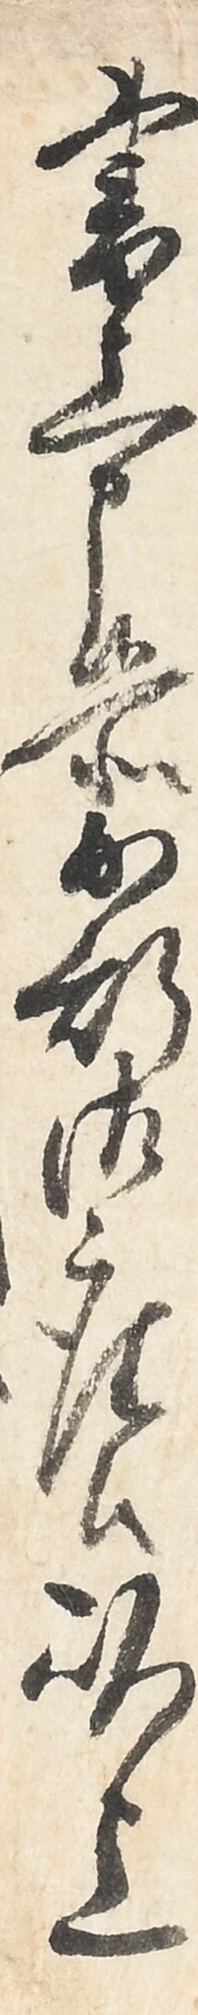書上申候所如斯御座候以上
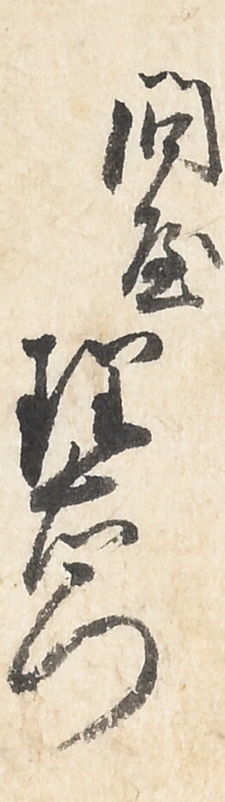亥理右衛門
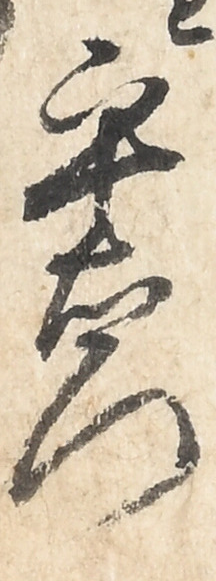平右衛門
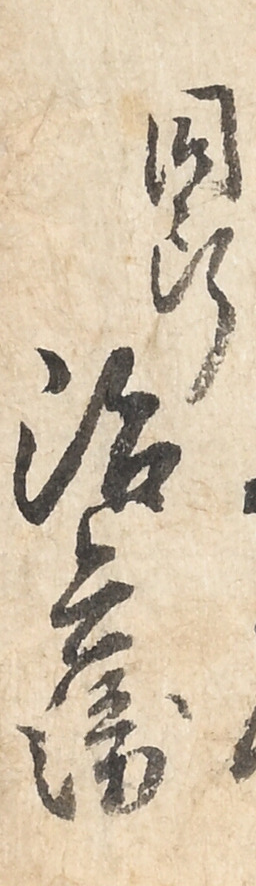治兵衛
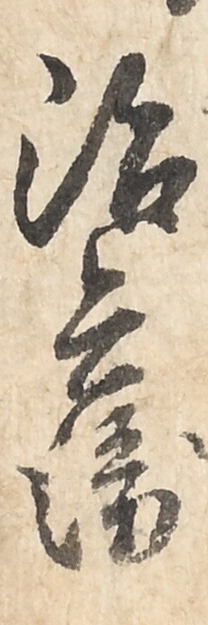治兵衛

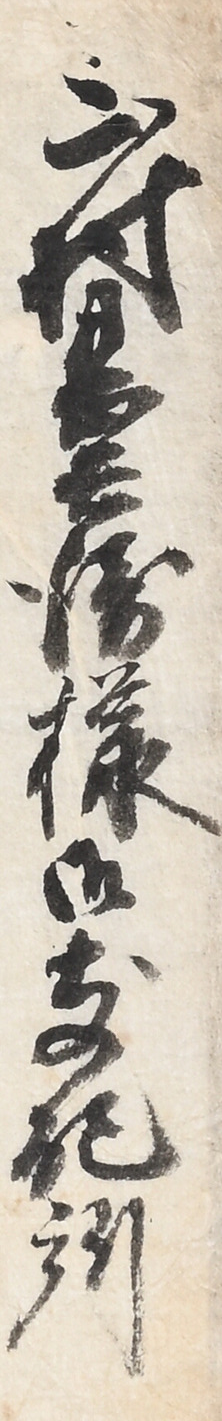山村甚兵衛様御支配所
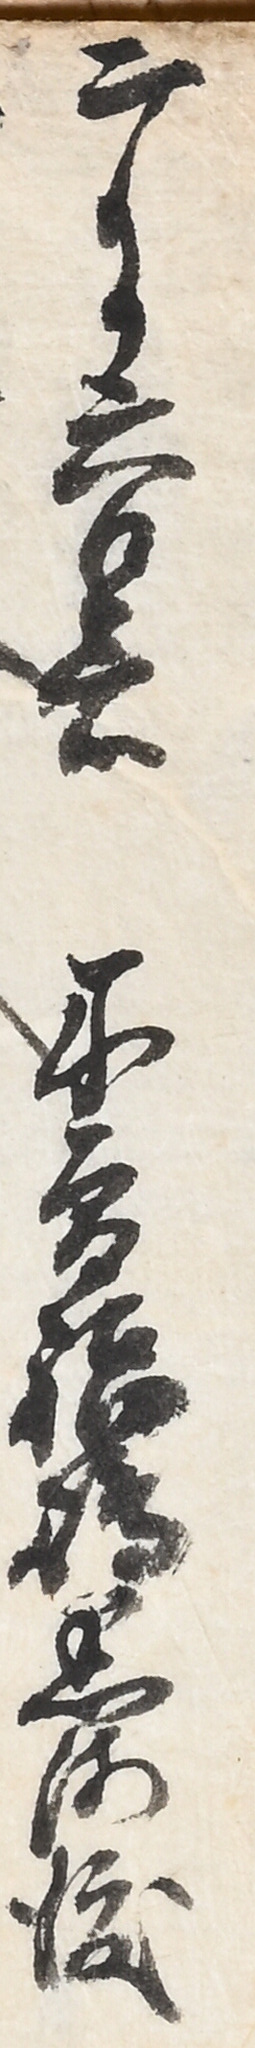二月六日昼木曽福嶋黒河渡
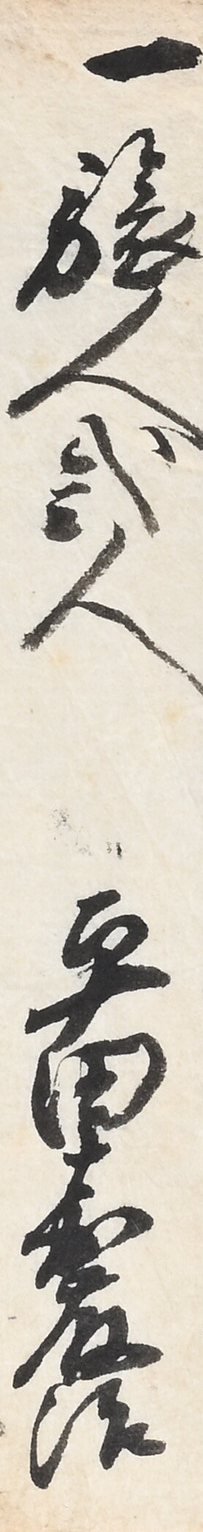一旅人弐人平田嘉藤治
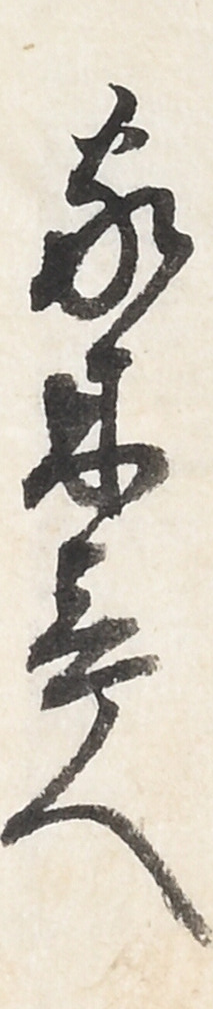家来壱人
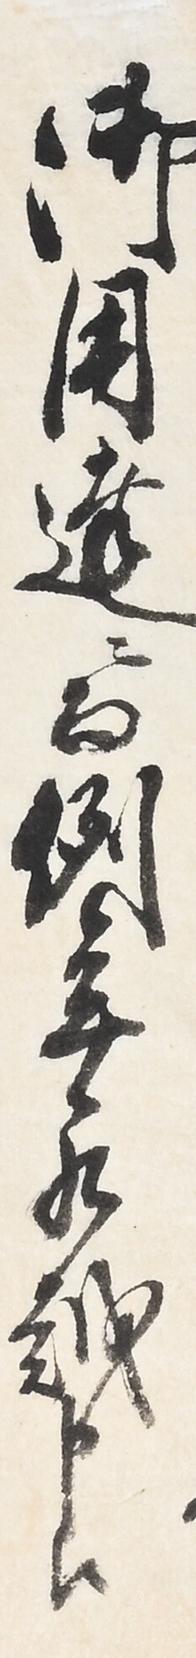御用達ニ而例年罷越申候
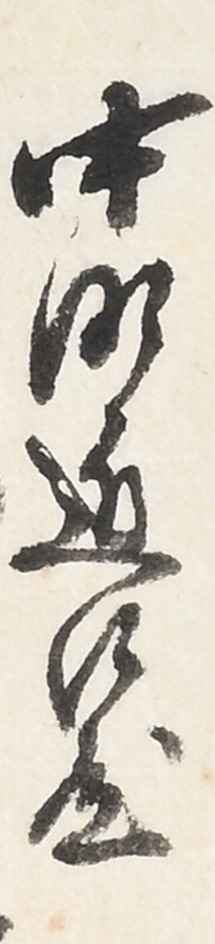中町近江屋
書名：旅人泊控帳
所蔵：伊那市立高遠町図書館・合同会社AMANE
